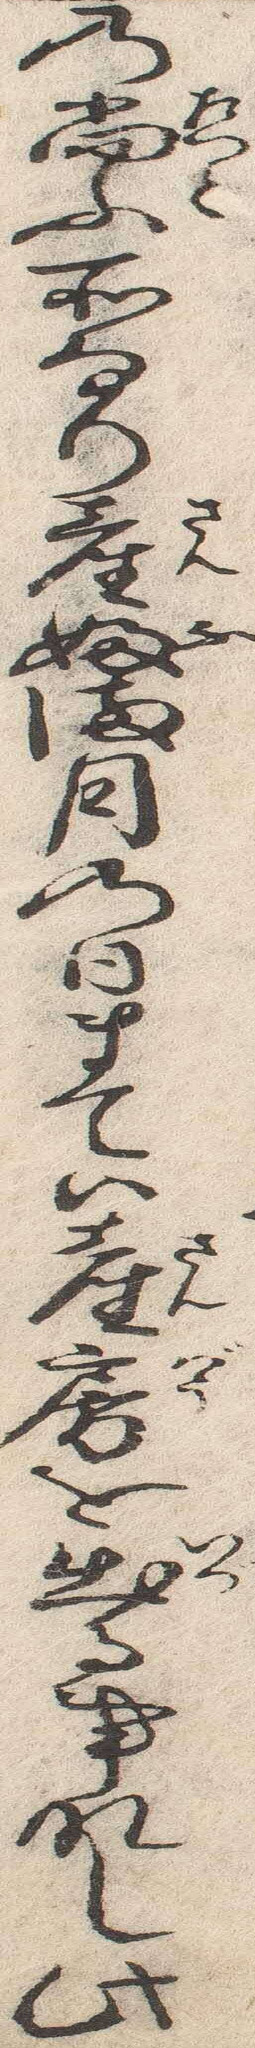の尚ふ所なり産婦満月の日まては産房を出る事なし此
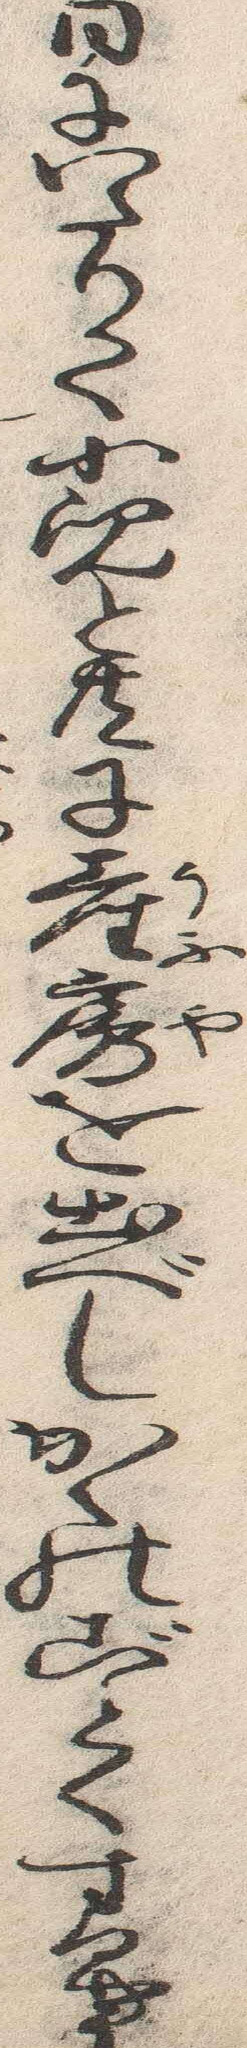日にいたりて小児と共に産房を出べしかくのごとくする事
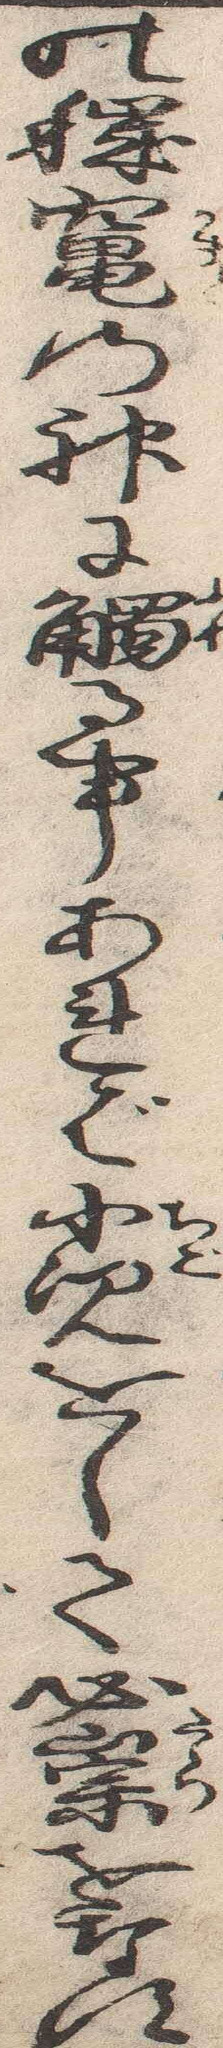の穢竈の神に觸る事あれば小児をして必祟をなす
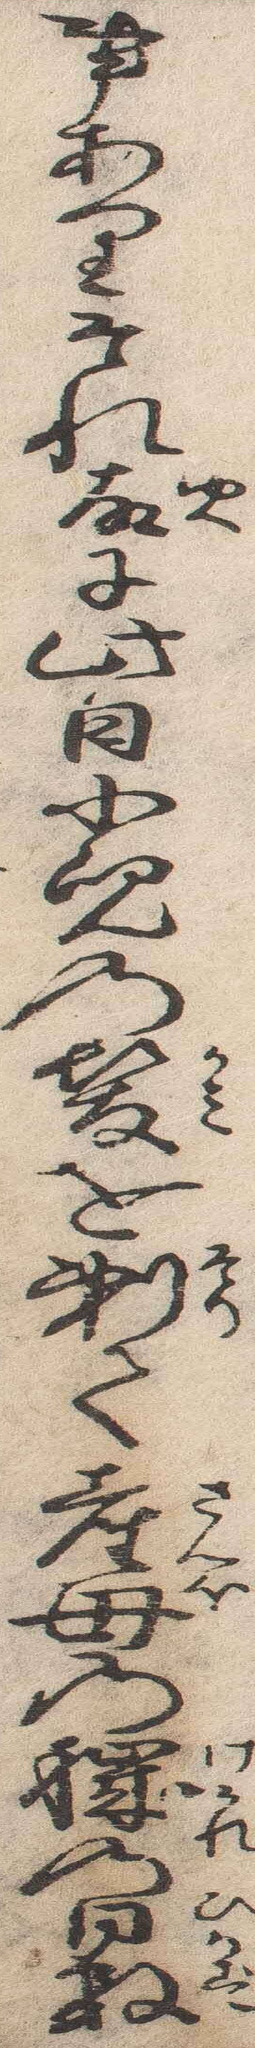事ありそれ故に此日小児の髪を剃て産母の穢の日数

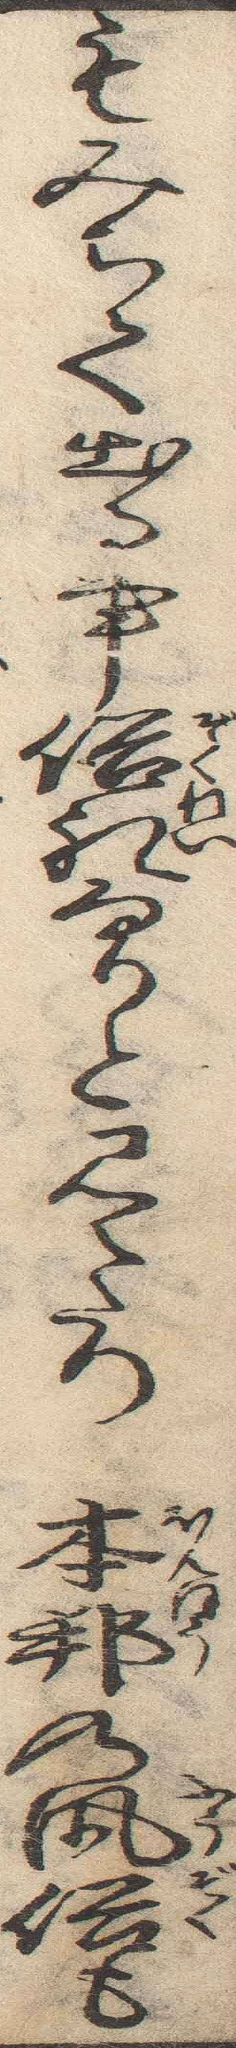もみちて出る事俗礼なりと見えたり本邦の風俗も
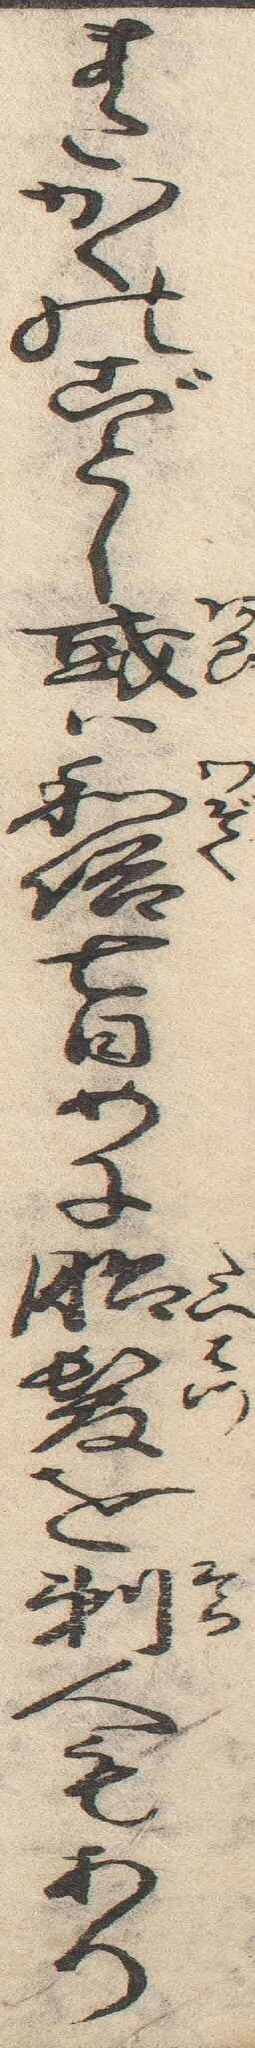またかくのごとし或は和俗七日めに胎髪を剃人もあり
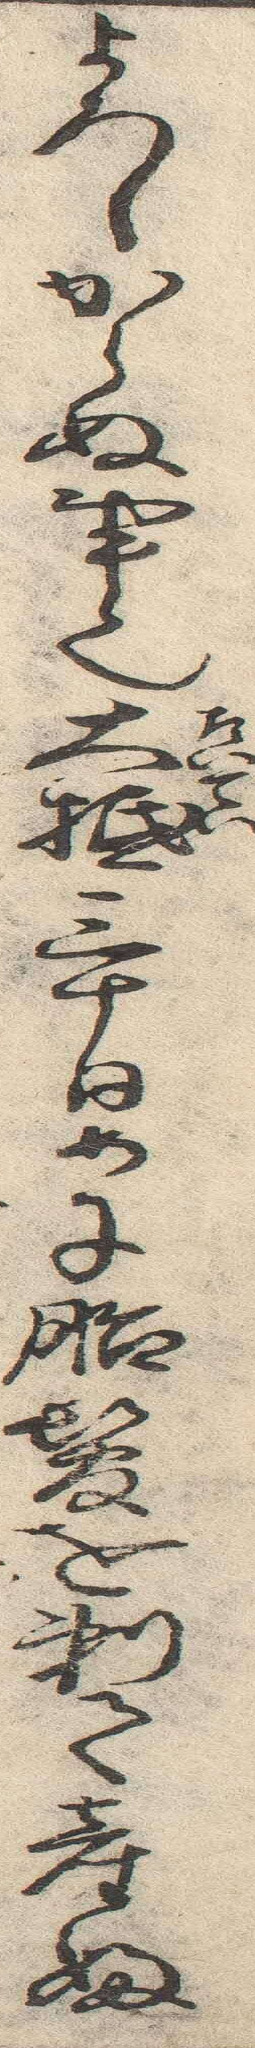よろしからぬ事也大抵三十日めに胎髪を剃て産婦
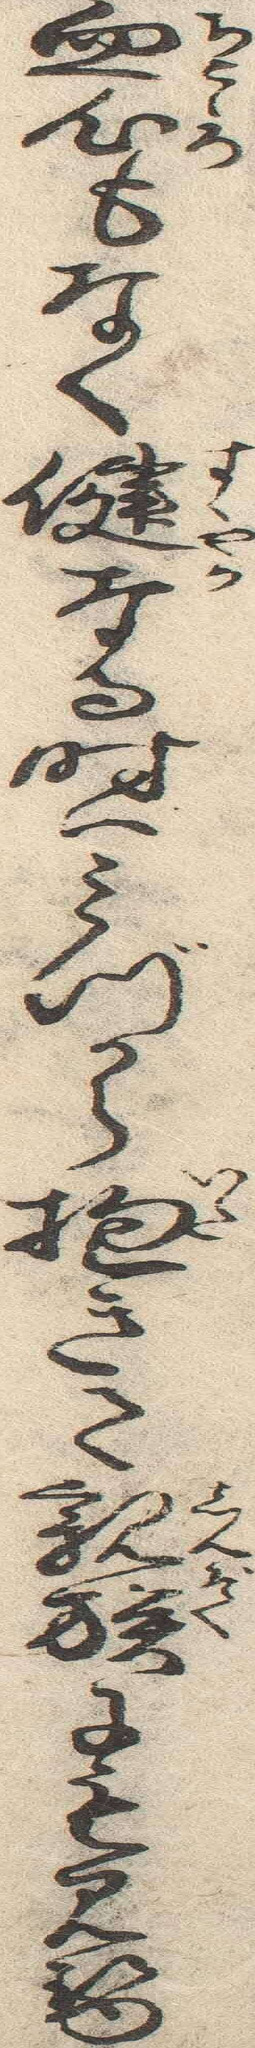血心もなく健なる時はみづから抱きて親族にも見せ
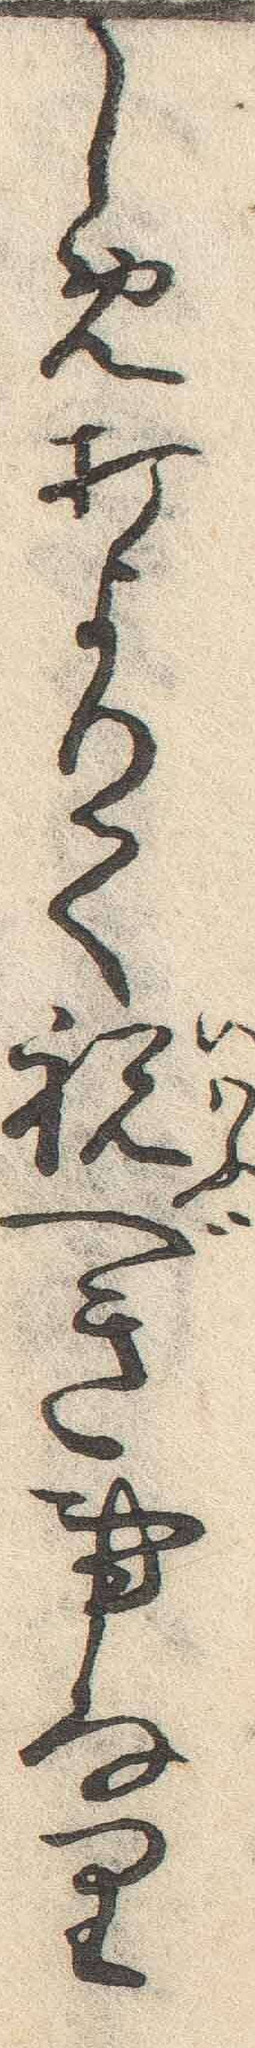しめ打よりて祝べき事なり
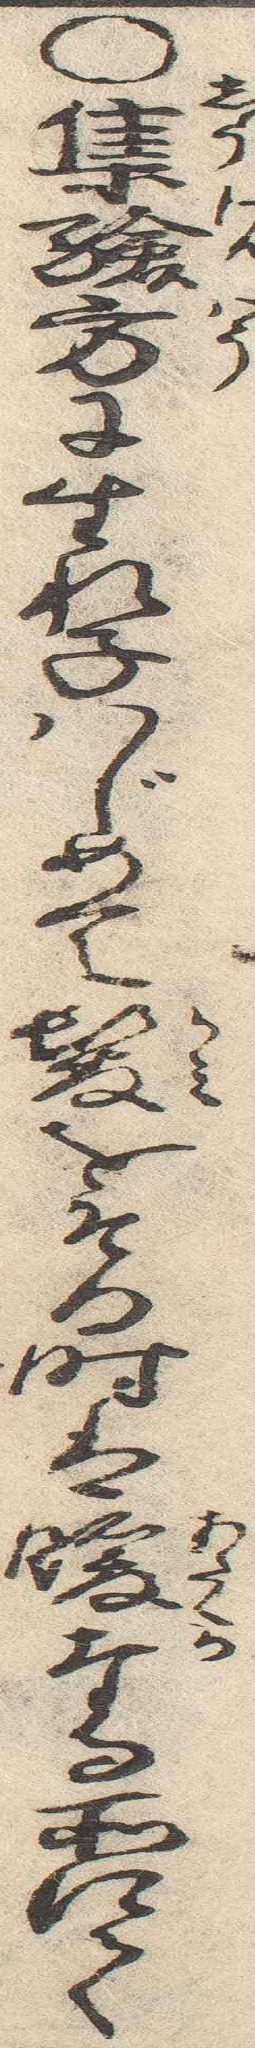◯集驗方に生れ子はじめて髪をそる時は暖なるところにて
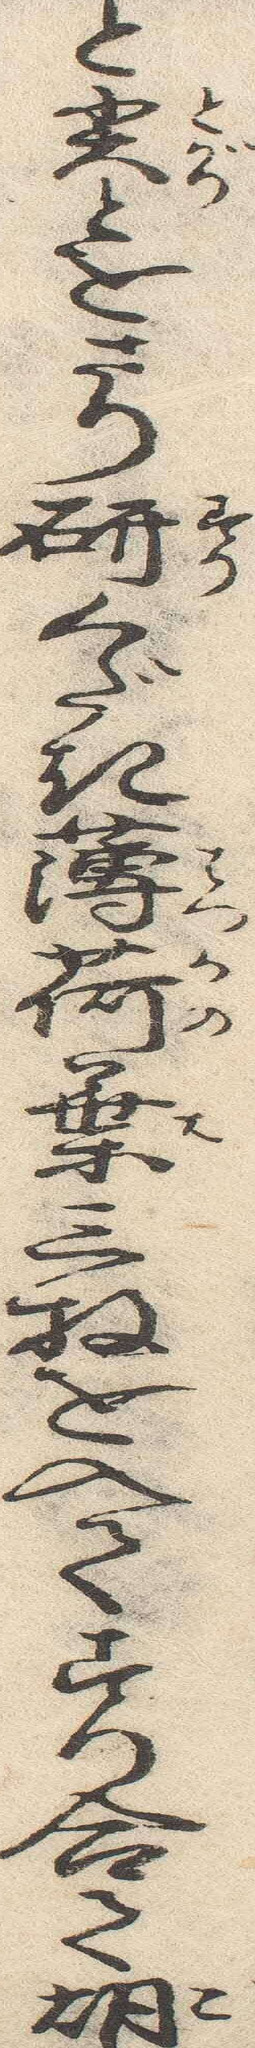と尖とをさり研くだき薄荷葉三枚を入てすり合て胡
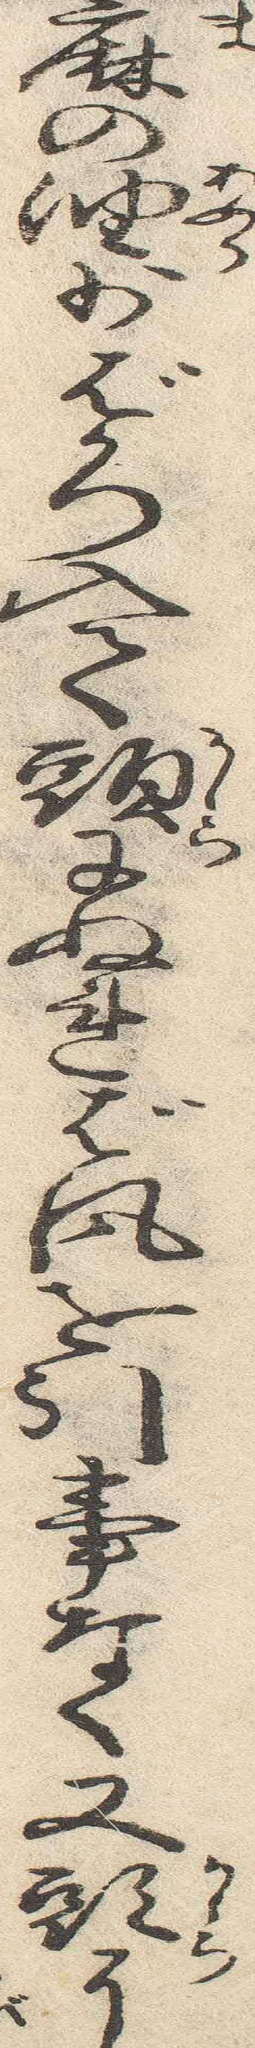麻の油少ばかり入て頭にぬれば風を引事なく又頭に
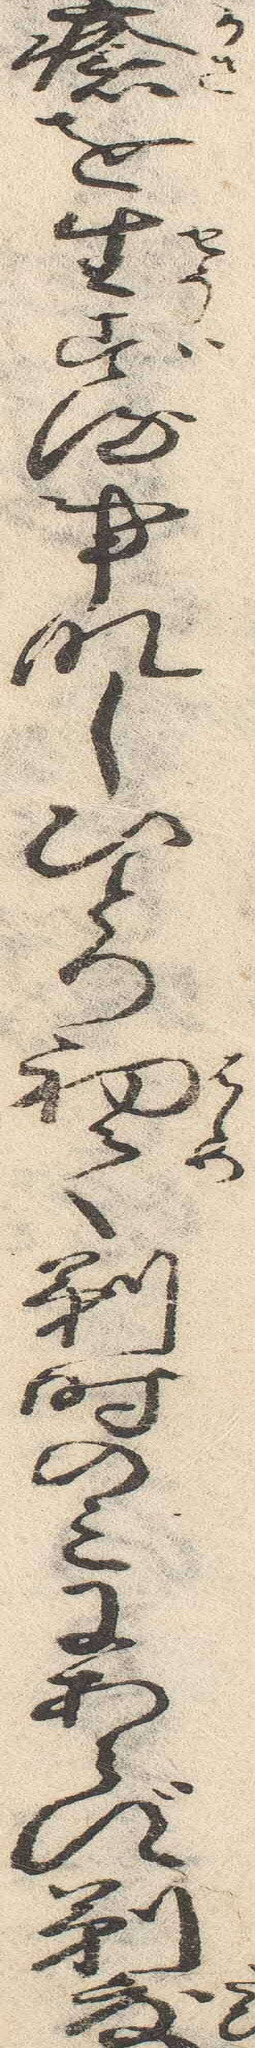瘡を生ずる事なしひとり初て剃時のみにあらず剃度
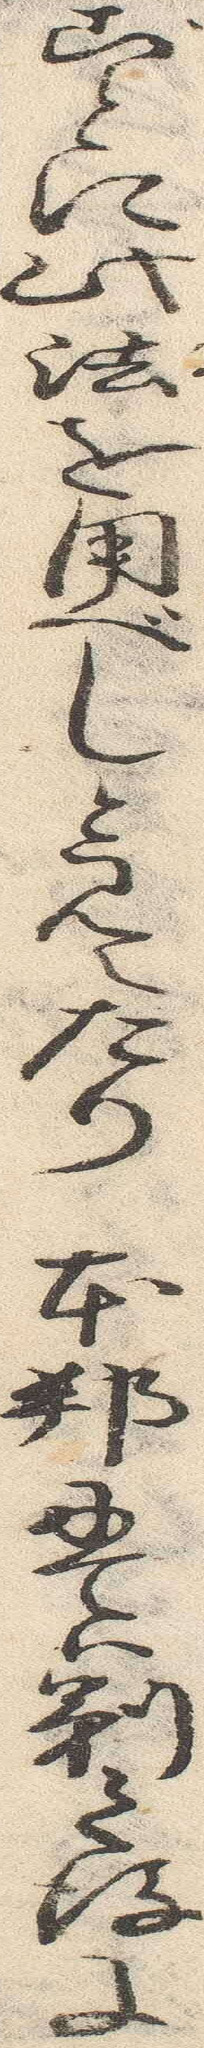ごとに此法を用べしと見えたり本邦にては剃て後に
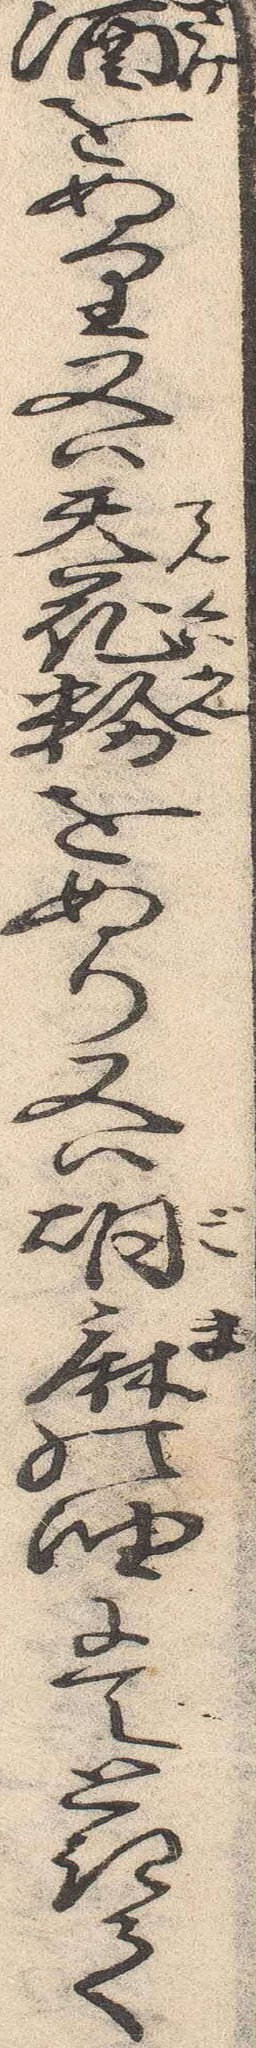酒をぬり又は天花粉をぬり又は胡麻の油にてときて
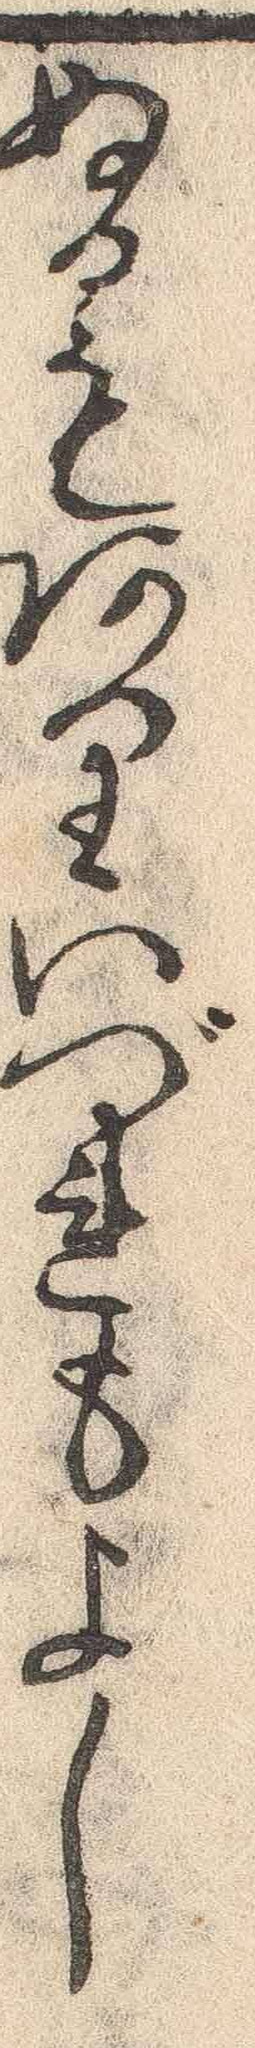ぬるもありいづれもよし
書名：小児必用養育草
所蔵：東京学芸大学附属図書館 国文学研究資料館
